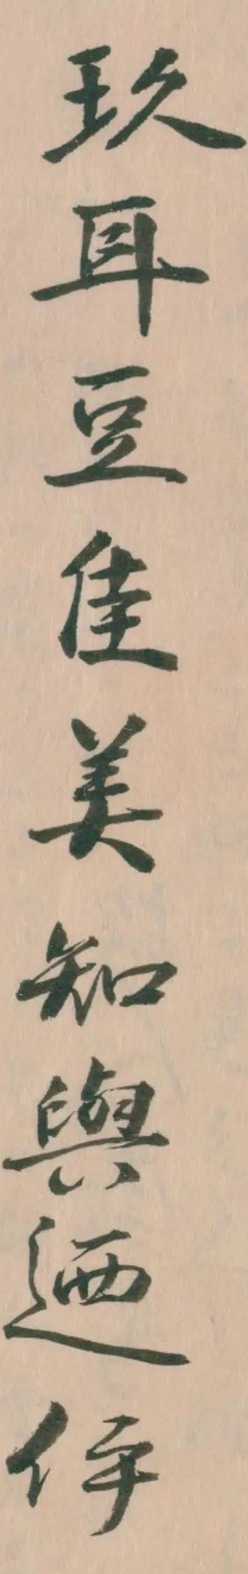玖耳豆佳美知與廼伊
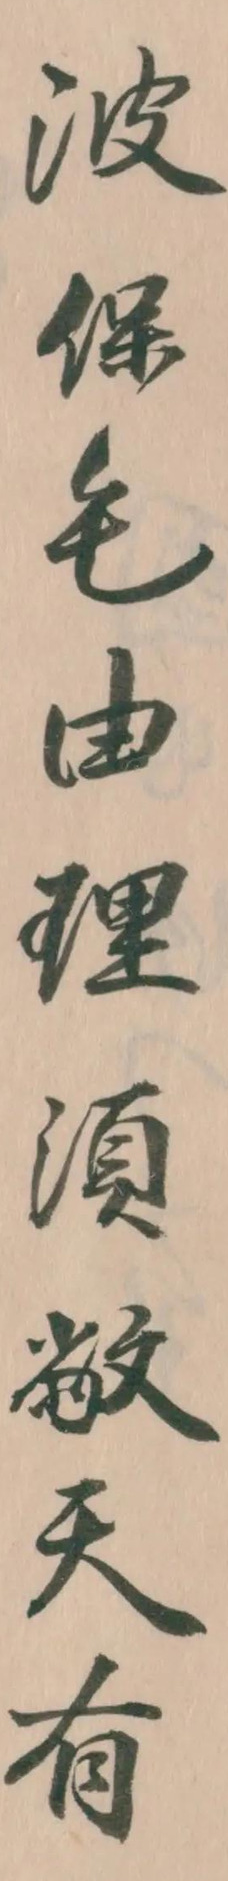波保毛由理須敝天有
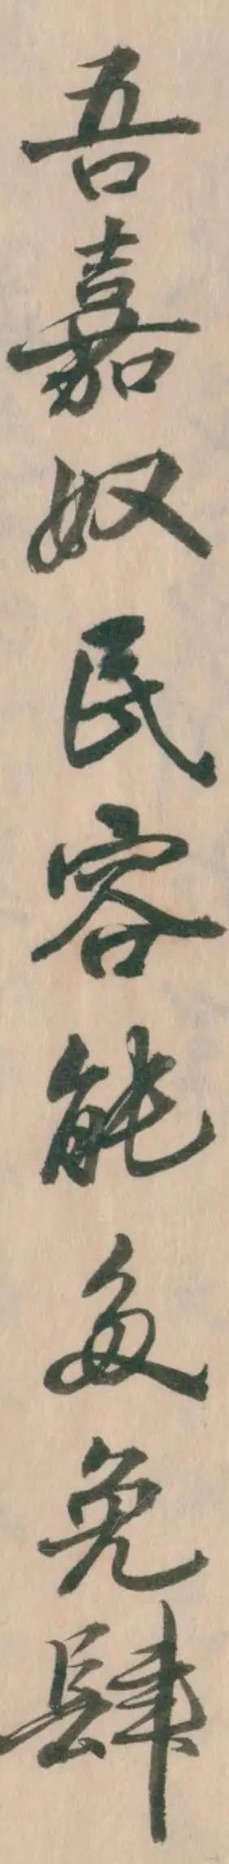吾嘉奴民容能多免̪肆
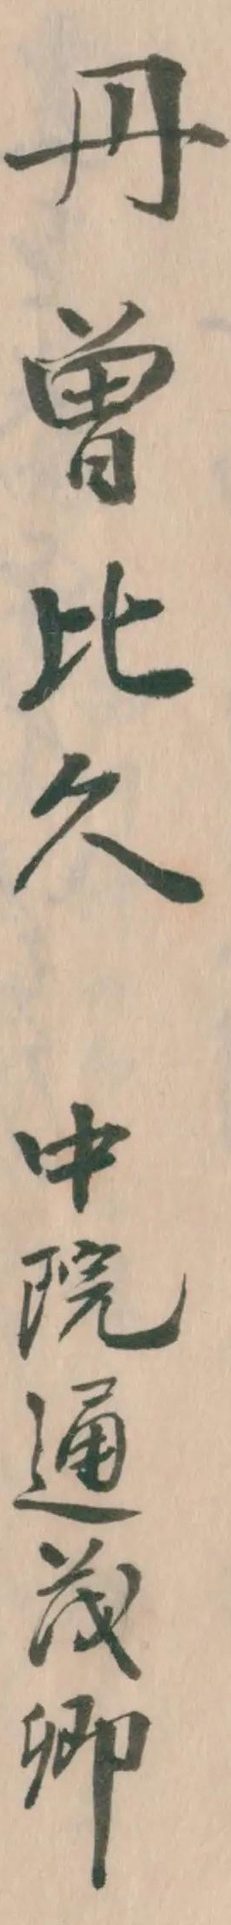丹曽比久中院通茂卿

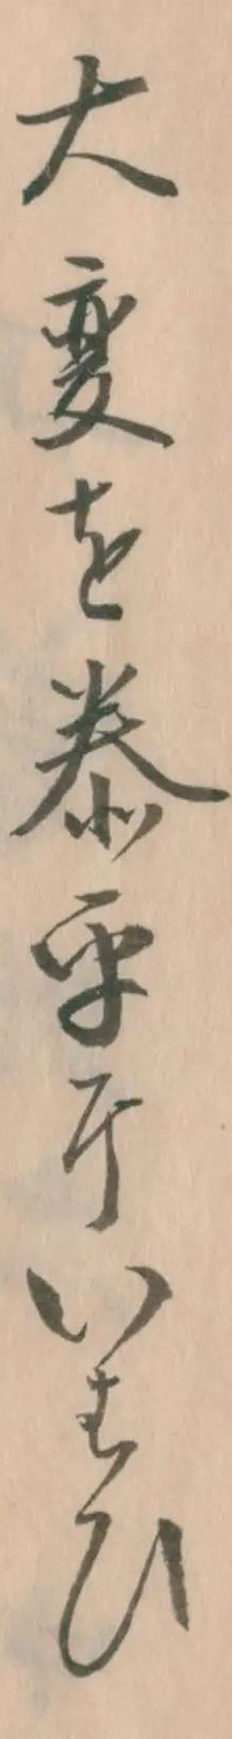大変を泰平にいはひ
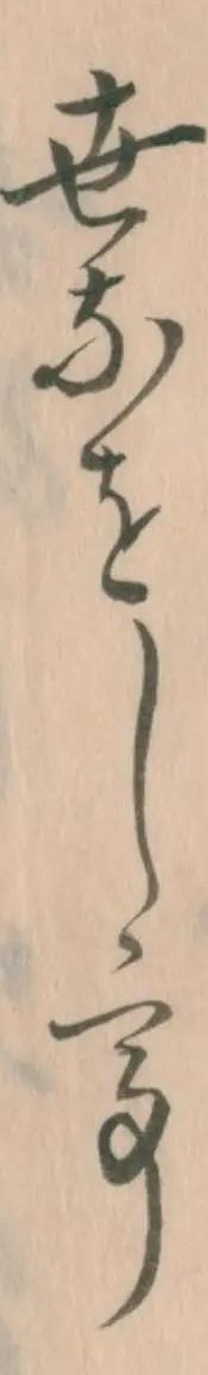世なをして
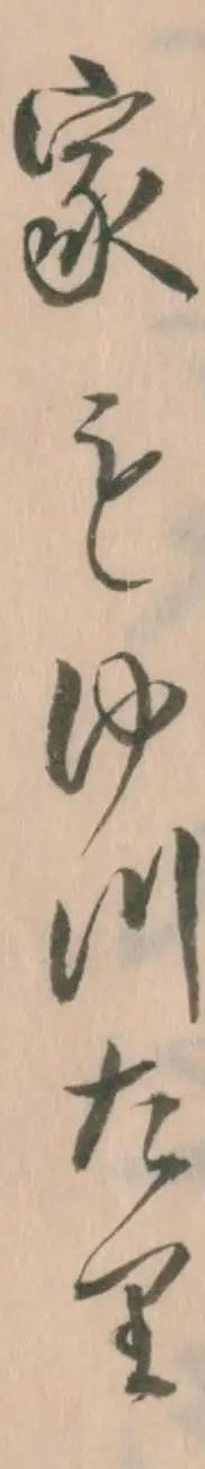家もゆつたり
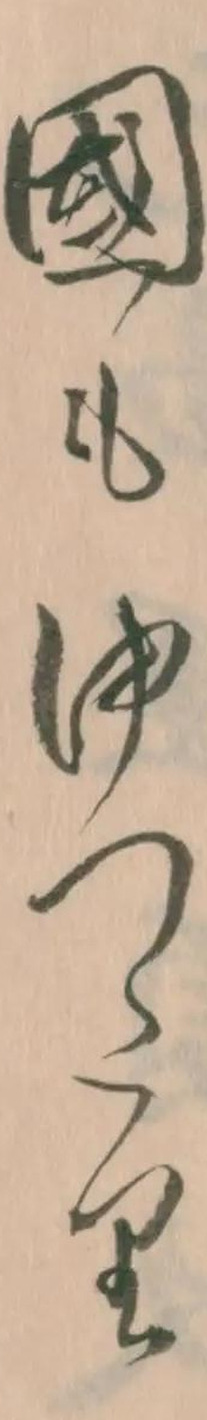国もゆつたり
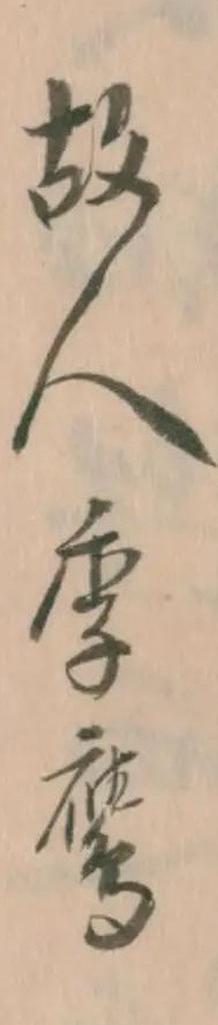故人季鷹
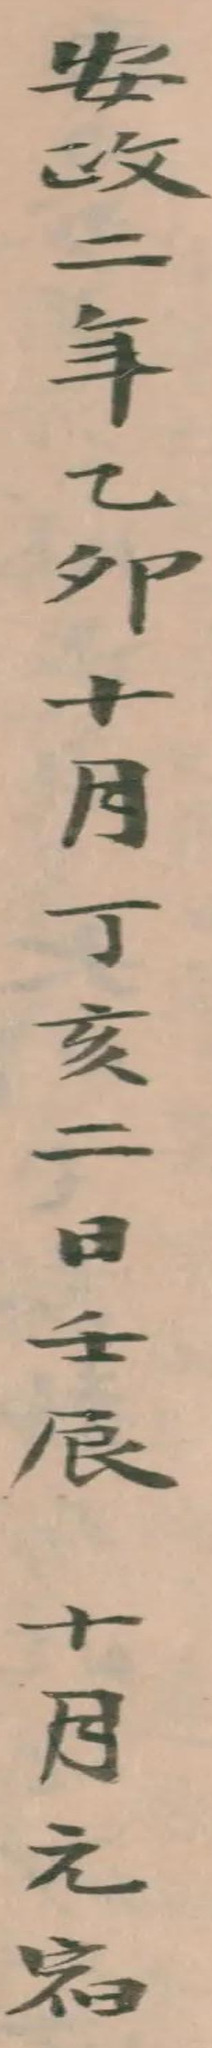安政二年乙卯十月丁亥二日壬辰十月元宿
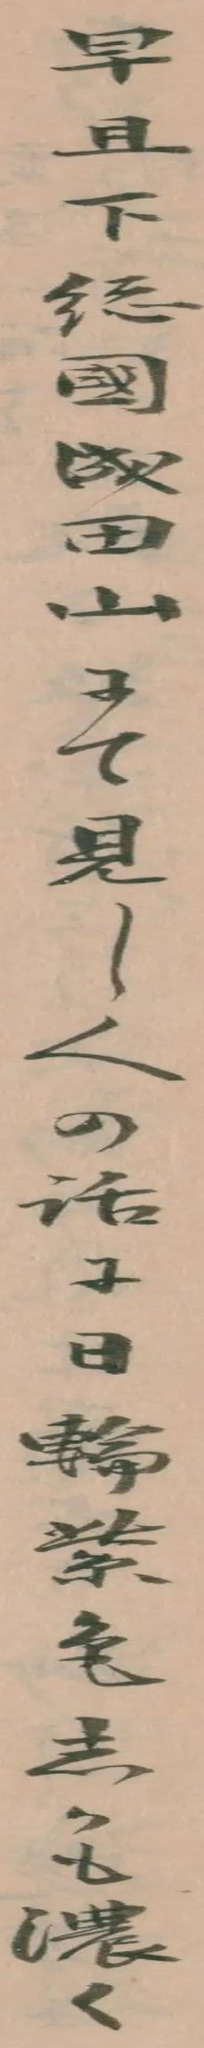早旦下総国成田山にて見し人の話に日輪紫色しかも濃く
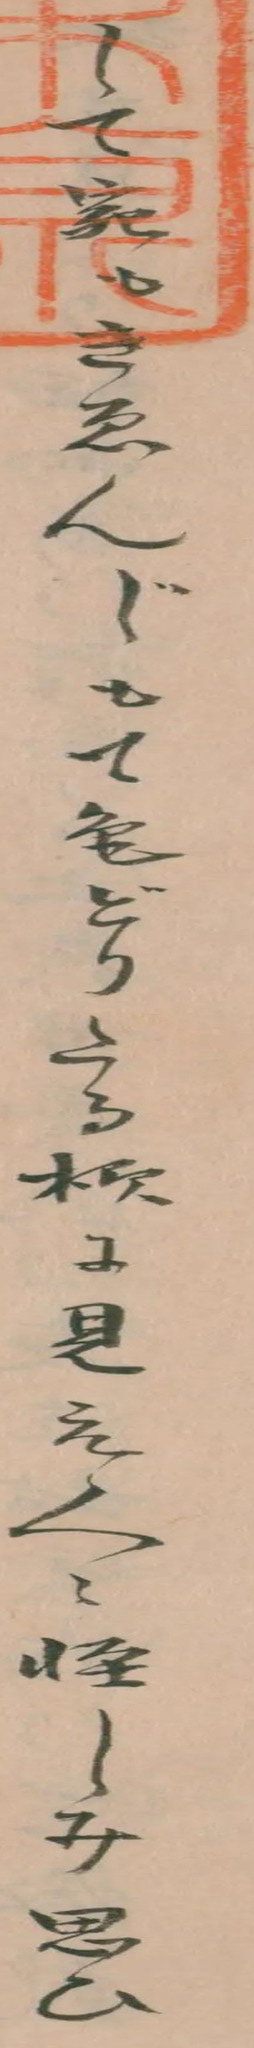して宛もきゑんじもて色どりたる様に見え人々怪しみ思ひ
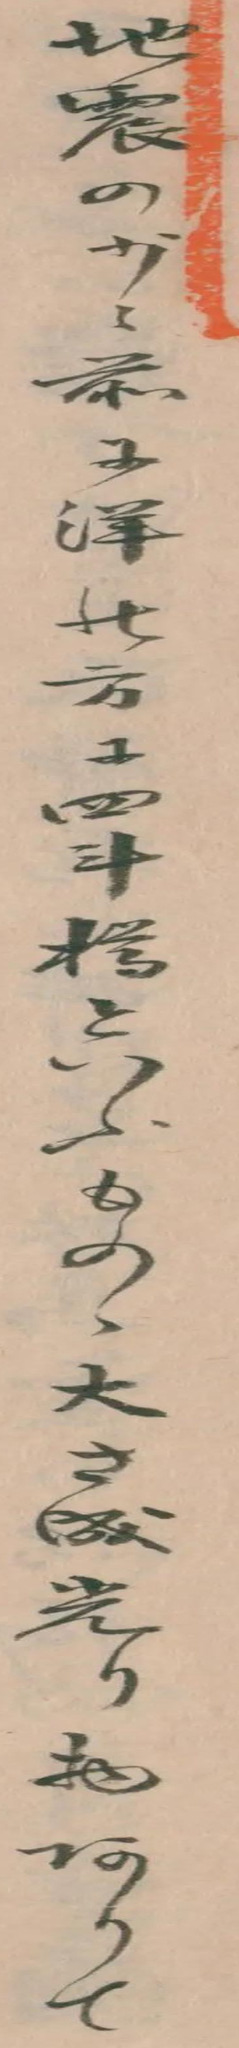地震の少々前に洋の方に四斗樽といふものゝ大さ成光り物ありて
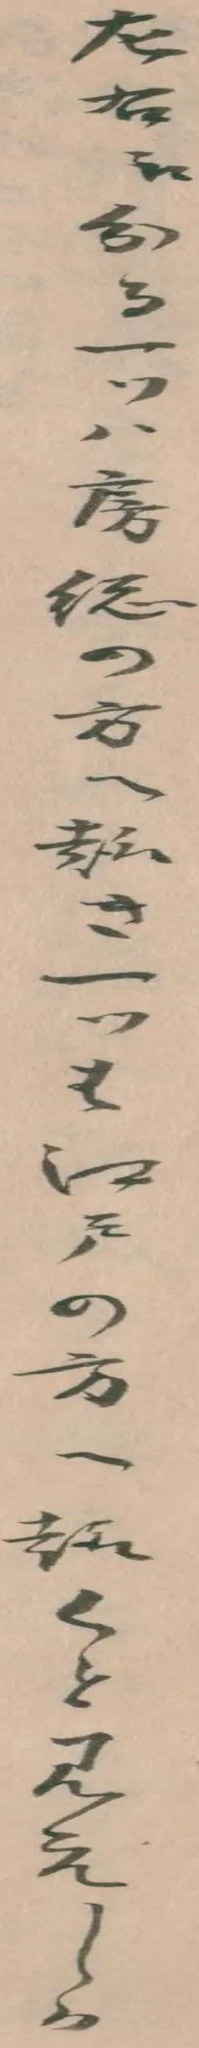左右え分る一ッハ房総の方へ趣き一ッは江戸の方へ趣くと見えしか
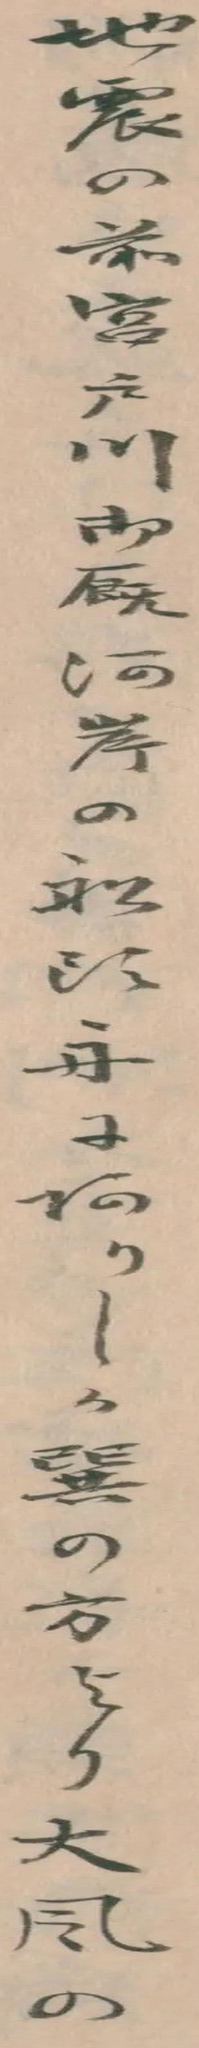地震の前宮戸川御厩河岸の船頭舟にありしか巽の方より大風の
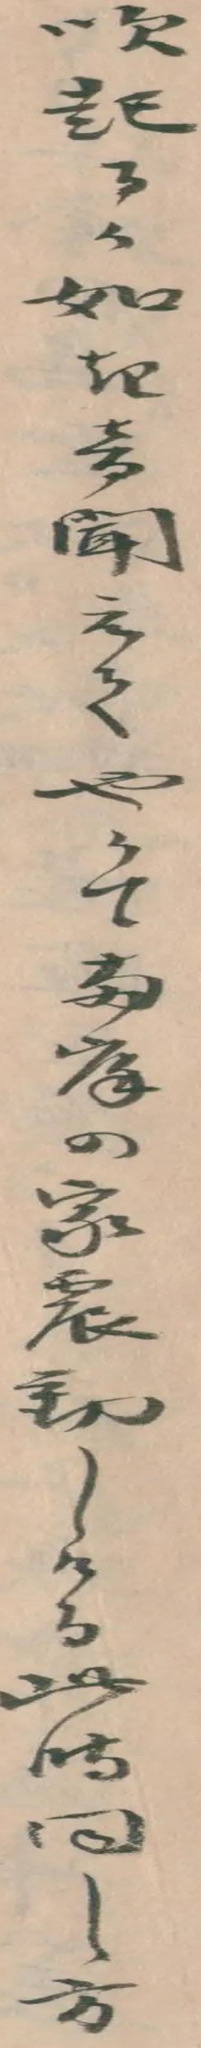吹起るか如き音聞えてやかて両岸の家震動しける此時同し方
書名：地災撮要. 巻7-9(地震之部)
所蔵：国立国会図書館 National Diet Library, JAPAN
